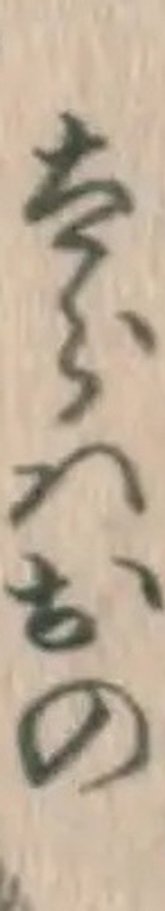太郎はおの
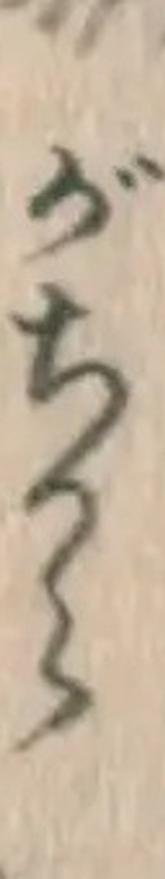がちから
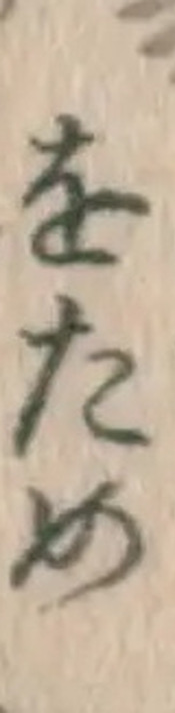をため
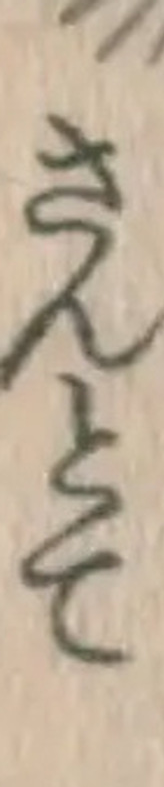さんとて
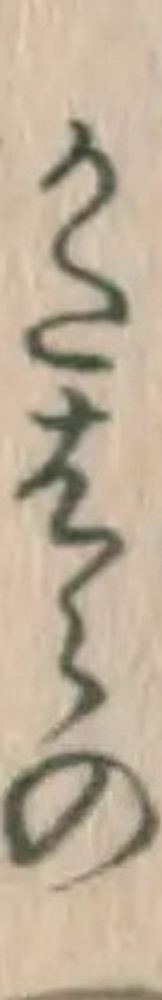かたはらの
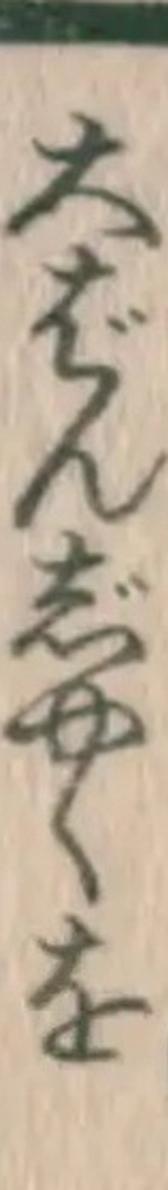大ばんじやくを
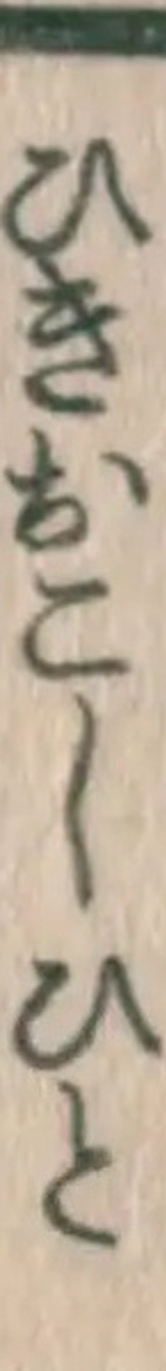ひきおこしひと
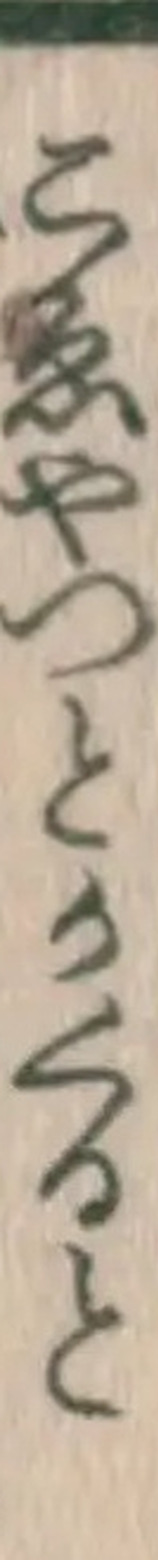こゑやつとかくると
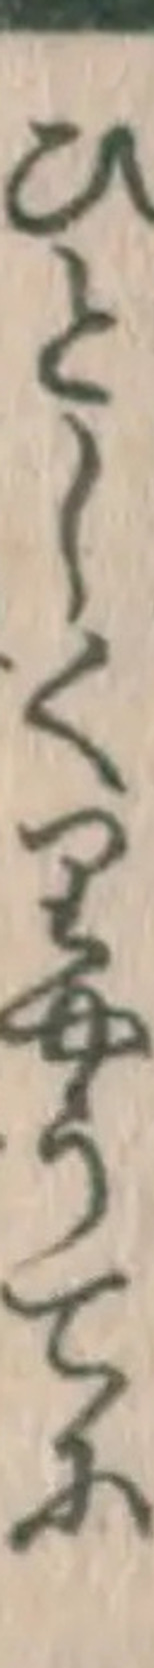ひとしくりやうてに
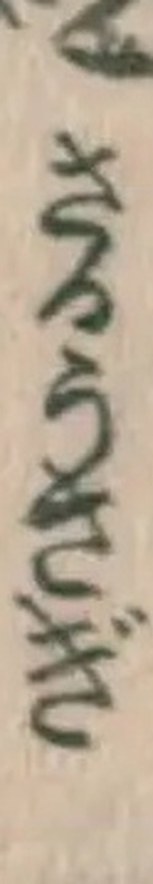さるうさぎ
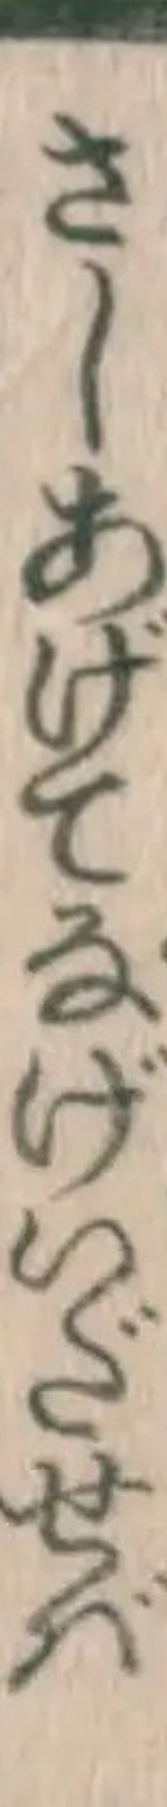さしあげてなげいだせば
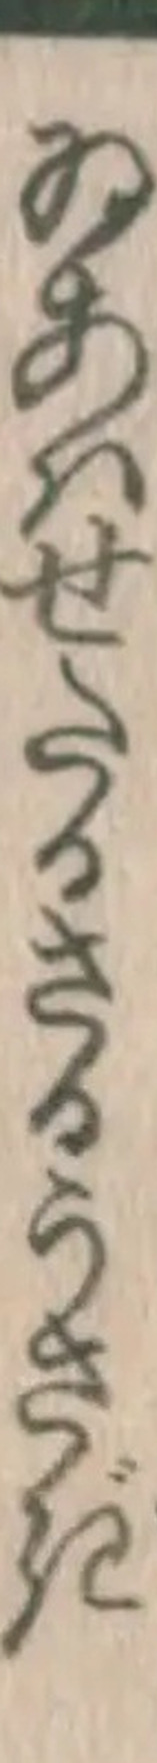ゐあはせたるさるうさぎ
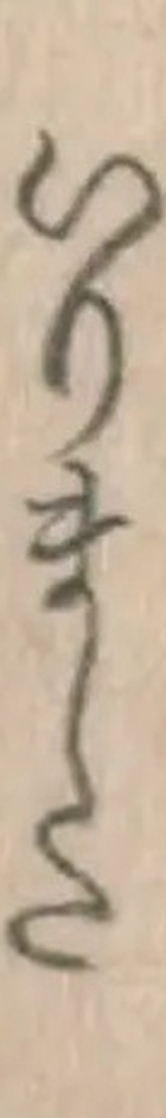いりました
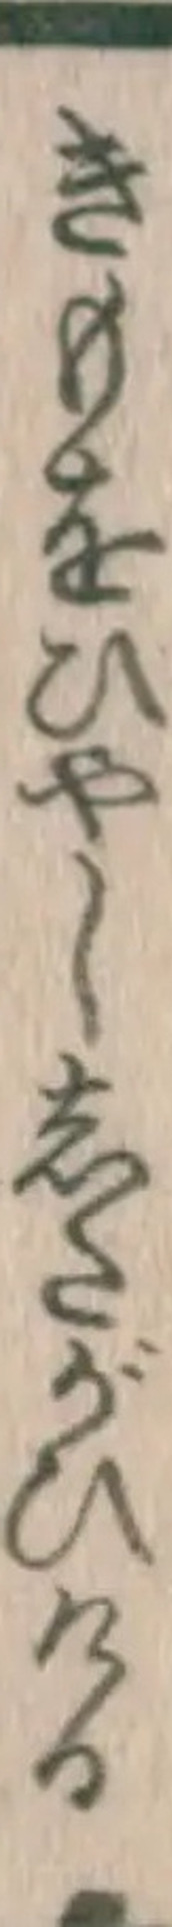きもをひやししたがひける

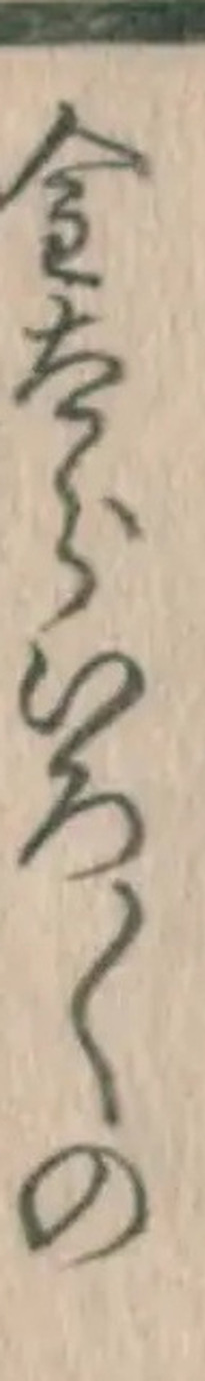金太郎いろ〳〵の
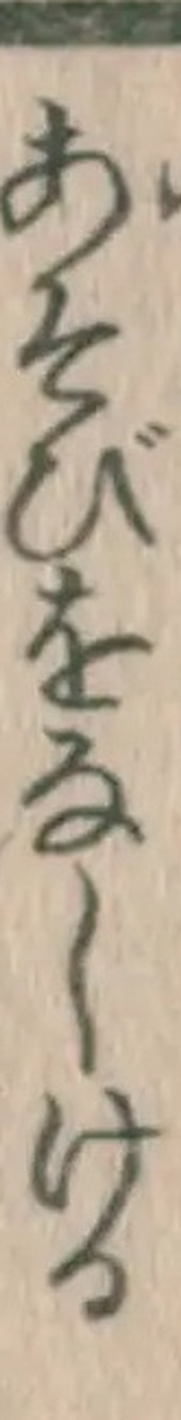あそびをなしける
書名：金太郎
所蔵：国立国会図書館 National Diet Library, JAPAN
